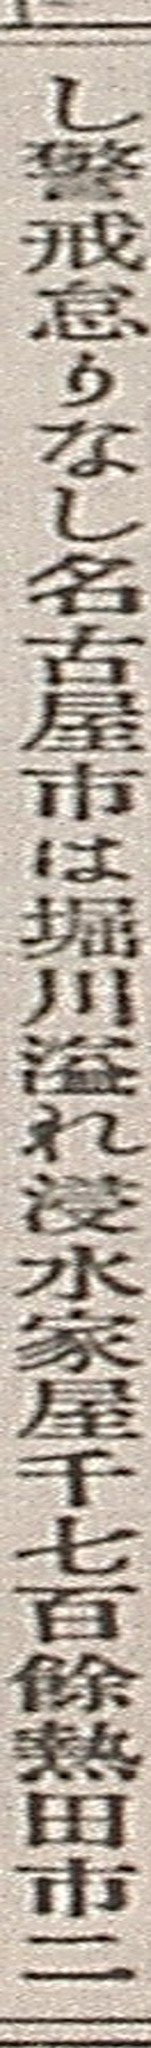し警戒怠りなし名古屋市は堀川溢れ浸水家屋千七百餘熱田市二
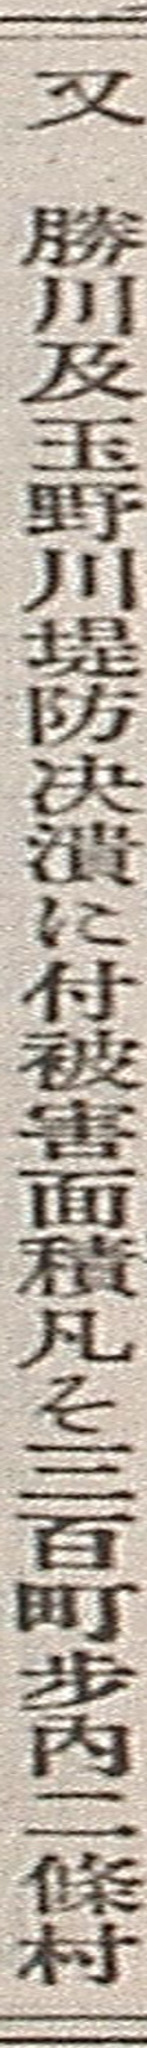又勝川及玉野川堤防决潰に付被害面積凡そ三百町歩内二條村
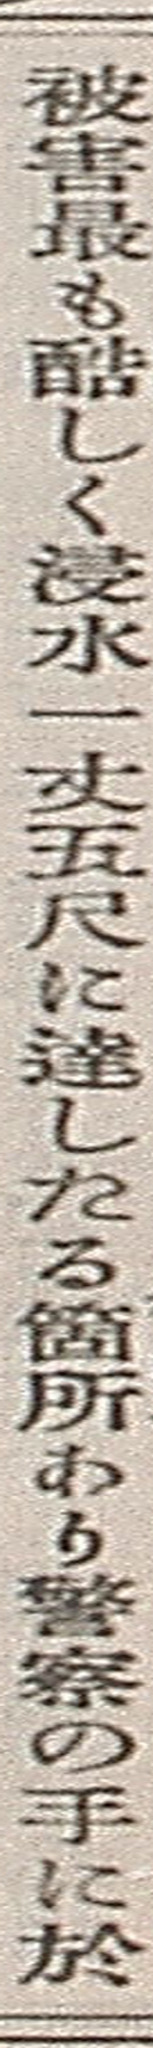被害最も酷しく浸水一丈五尺に達したる箇所あり警察の手に於
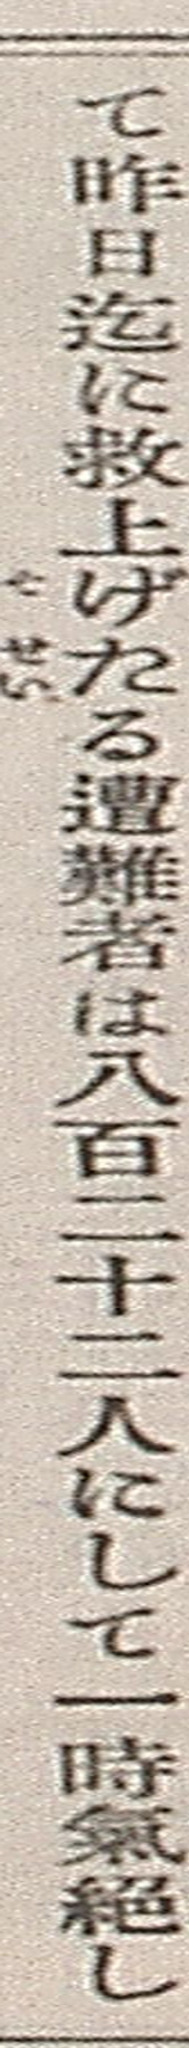て昨日迄に救上げたる遭難者は八百二十二人にして一時気絶し
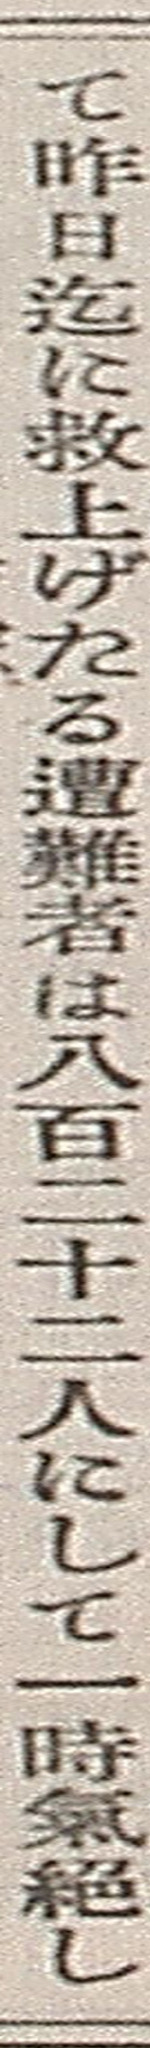て昨日迄に救上げたる遭難者は八百二十二人にして一時気絶し
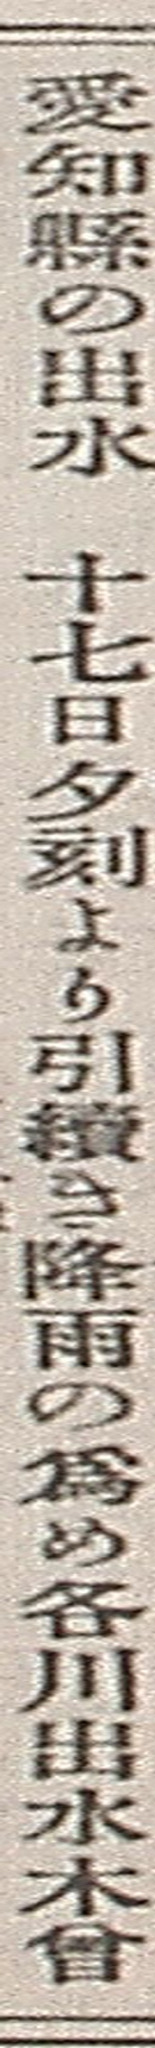愛知県の出水十七日夕刻より引続き降雨の為め各川出水木曽
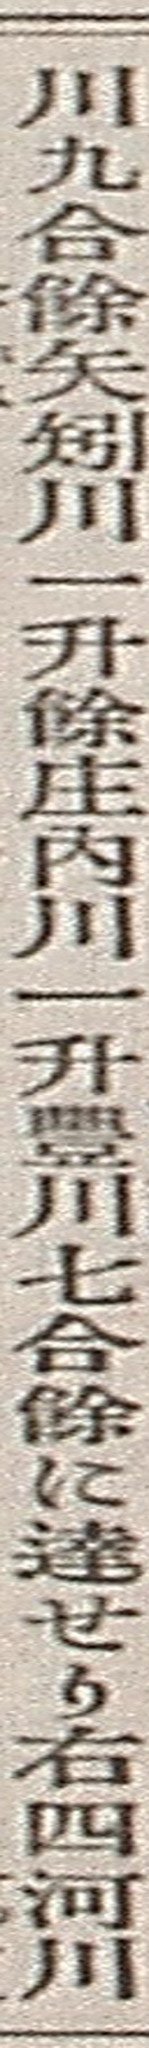川九合餘矢矧川一升餘庄内川一升豊川七合餘に達せり右四河川
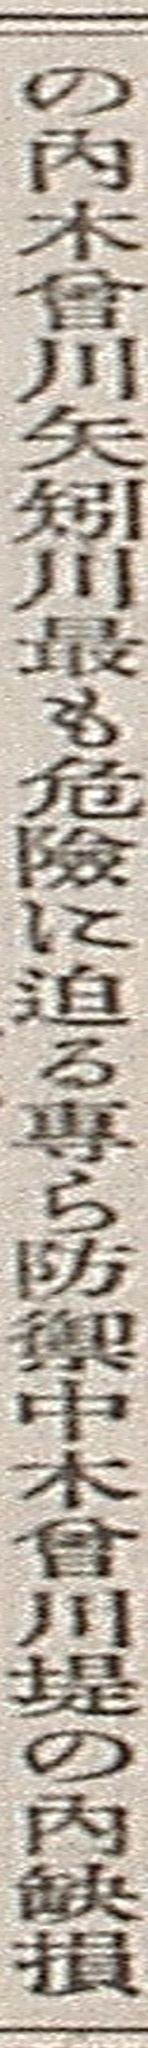の内木曽川矢矧川最も危険に迫る専ら防禦中木曽川堤の内缺損
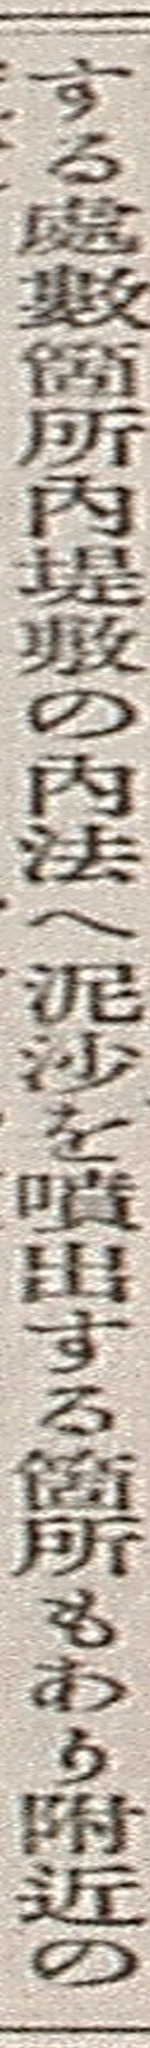する処数箇所内堤敷の内法へ泥沙を噴出する箇所のあり附近の
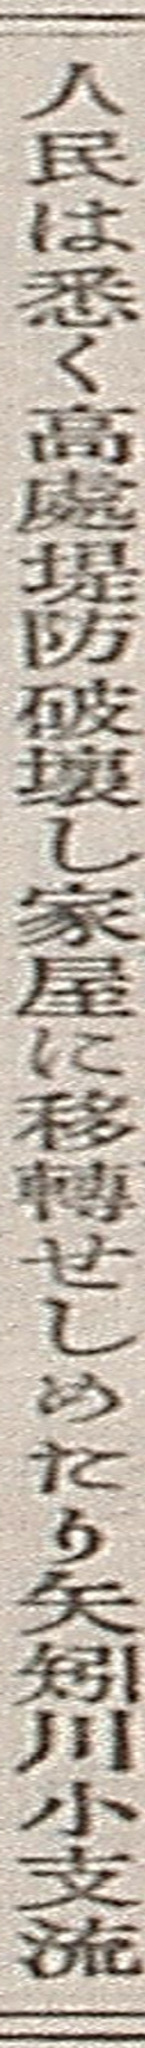人民は悉く高処堤防破壊し家屋に移転せしめたり矢矧川小支流
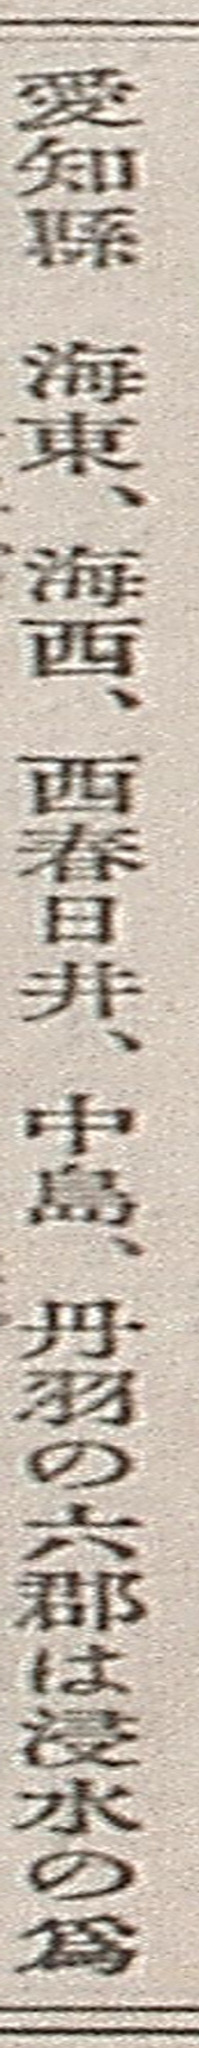愛知県海東、西春日井、中島、丹羽の六郡は浸水の為
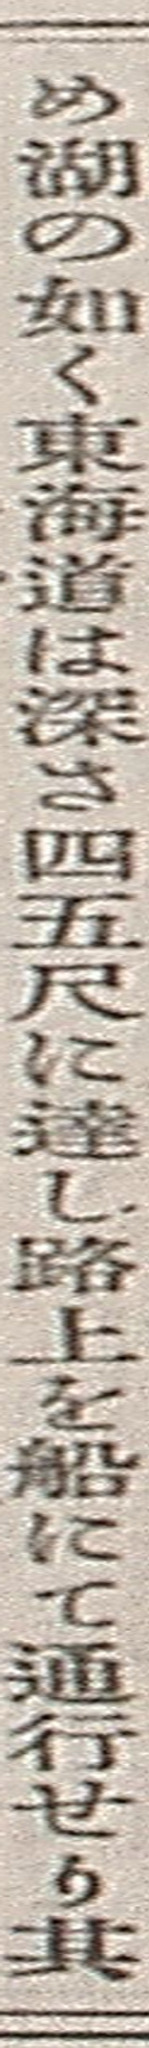め湖の如く東海道は深さ四五尺に達し路上を舟にて通行せり其
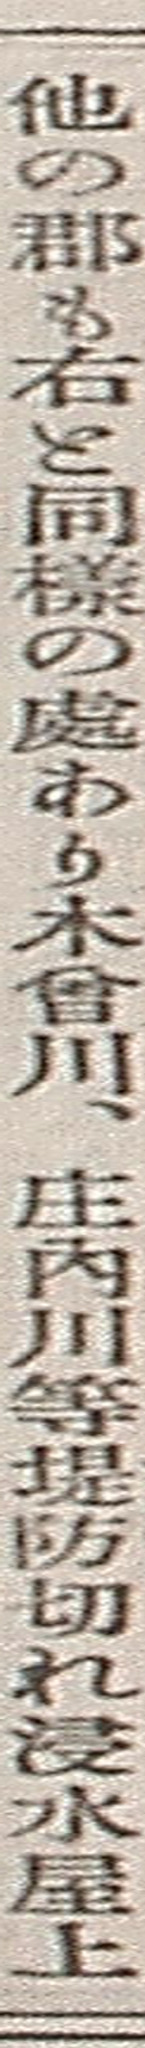他の郡も右と同様の処あり木曽川、庄内川等堤防切れ浸水屋上
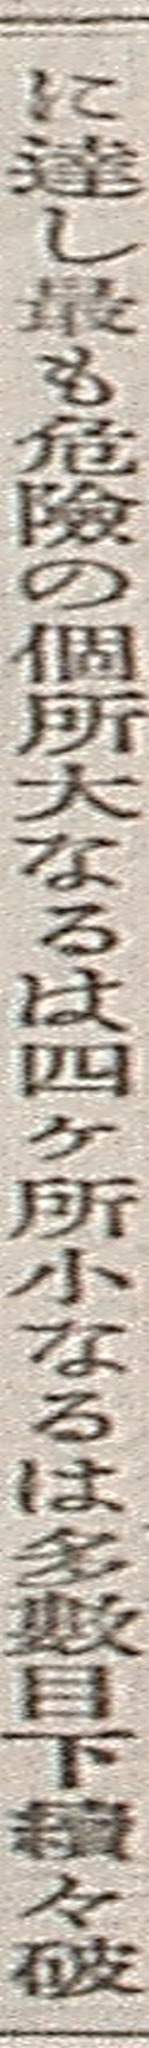に達し最も危険の個所大なるは四ヶ所小なるは多数目下続々破
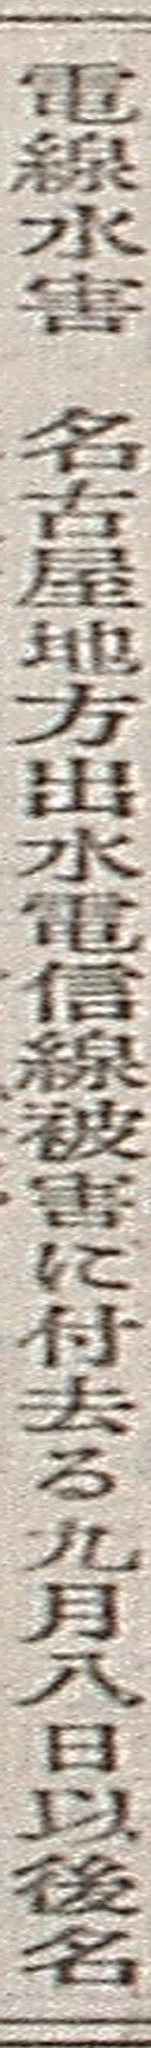電線水害名古屋地方出水電信線被害に付去る九月八日以後名
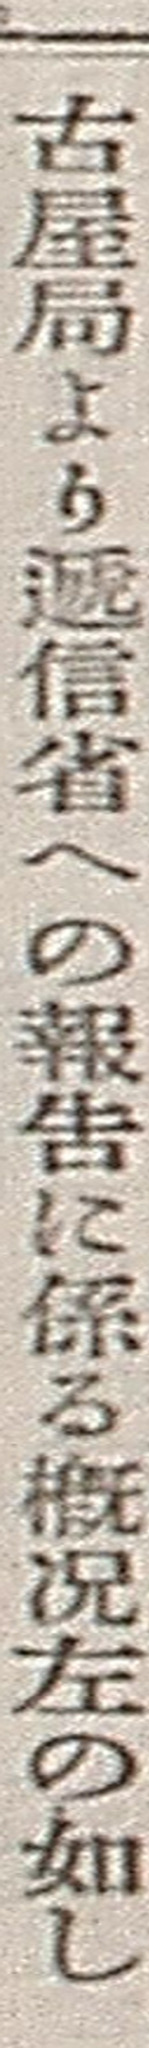古屋局より逓信省への報告に係る概況左の如し
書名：風俗畫報臨時増刊第百二十六號　洪水被害録（中）
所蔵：東京大学地震研究所図書室 Earthquake Research Institute Library, The University of Tokyo, JAPAN
